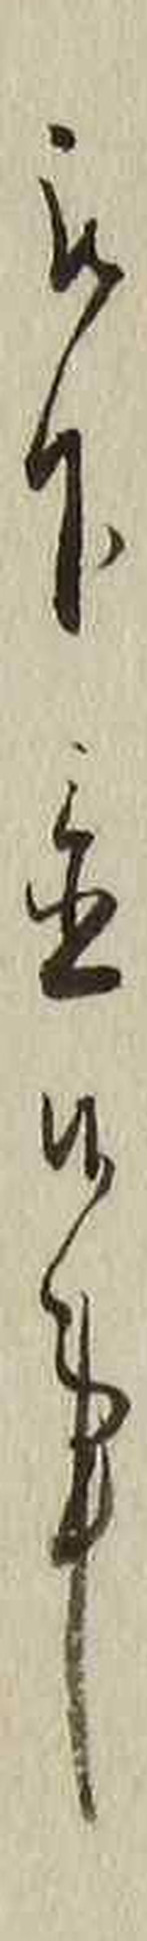被下置候事
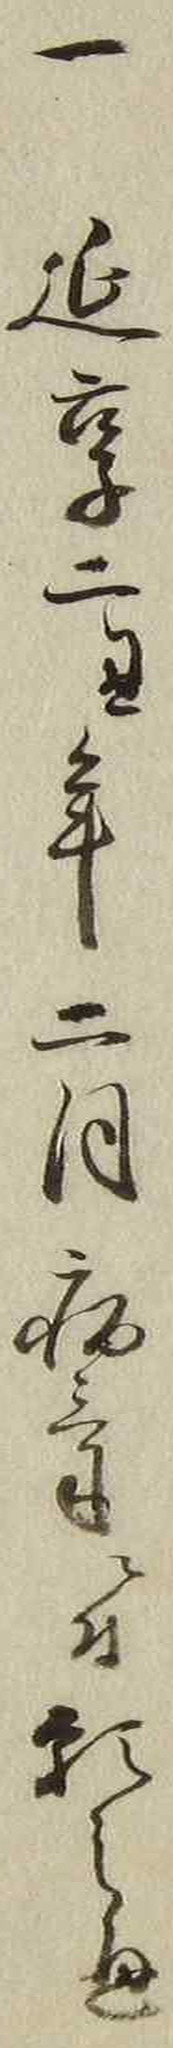一延享二丑年二月病気ニ付願之通
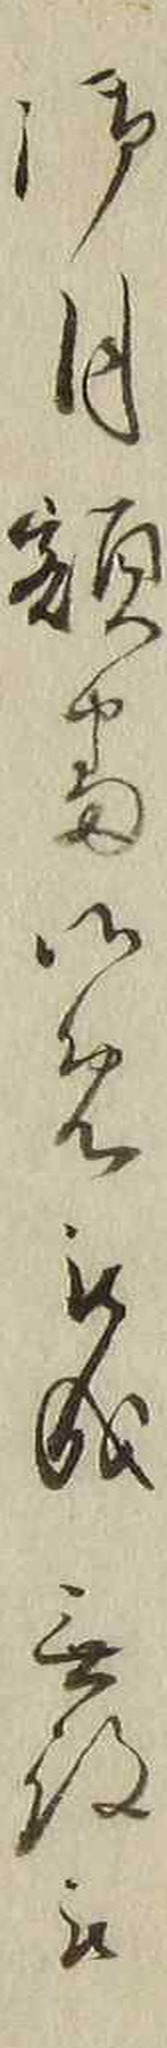御月額番御免被成無役被
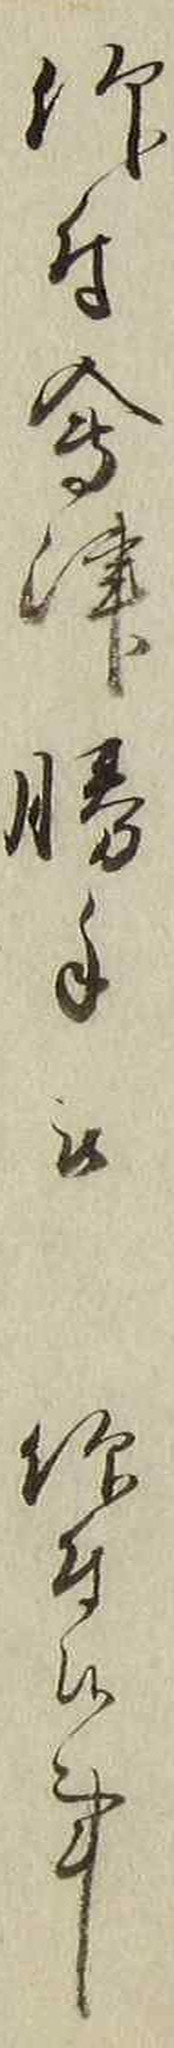仰付会津勝手被仰付候事
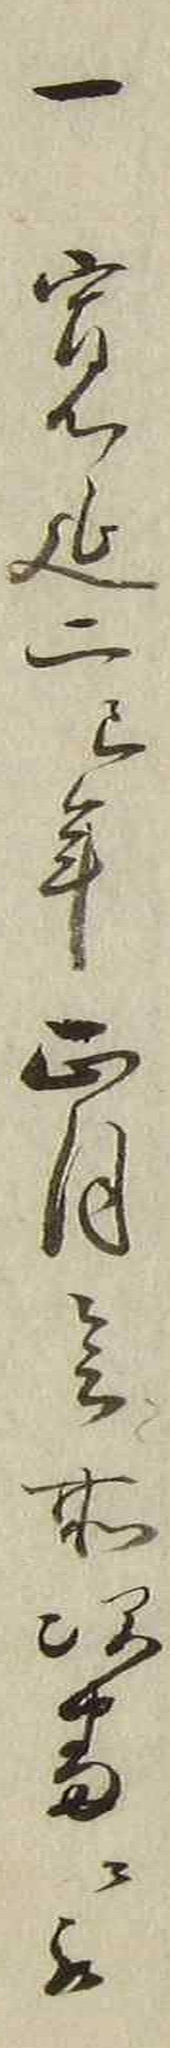一寛延二巳年正月会所次番ニ被
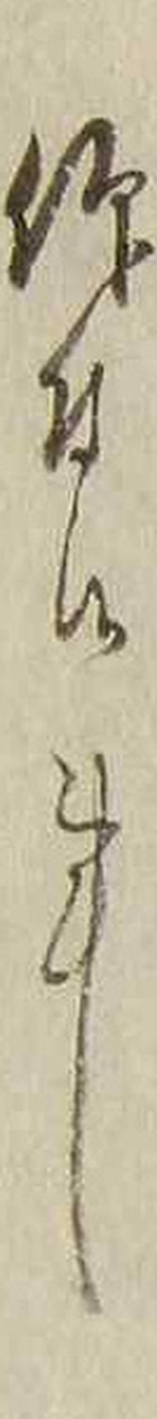仰付候事

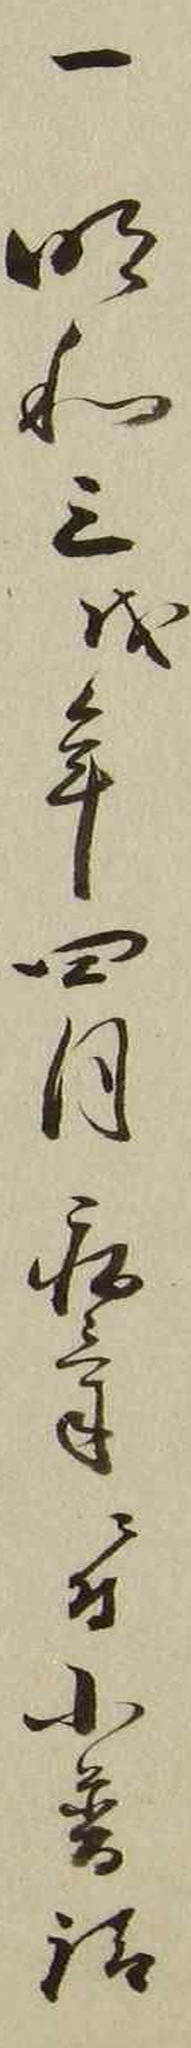一明和三戌年四月病気ニ付小普請
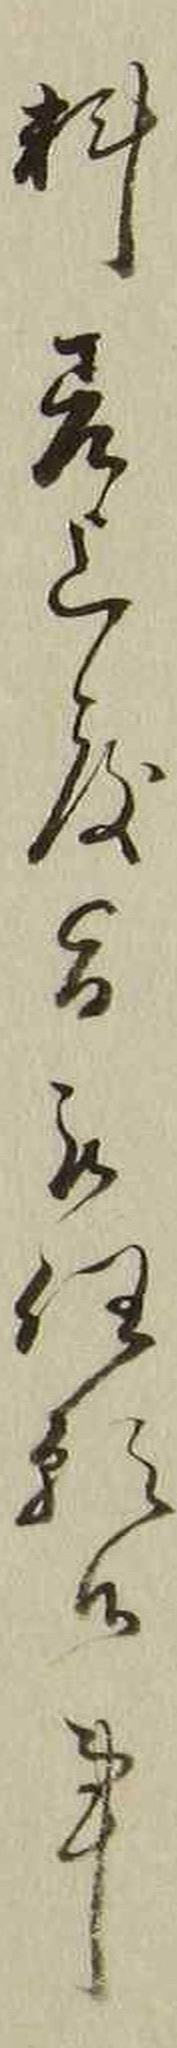料差上度旨被任願候事
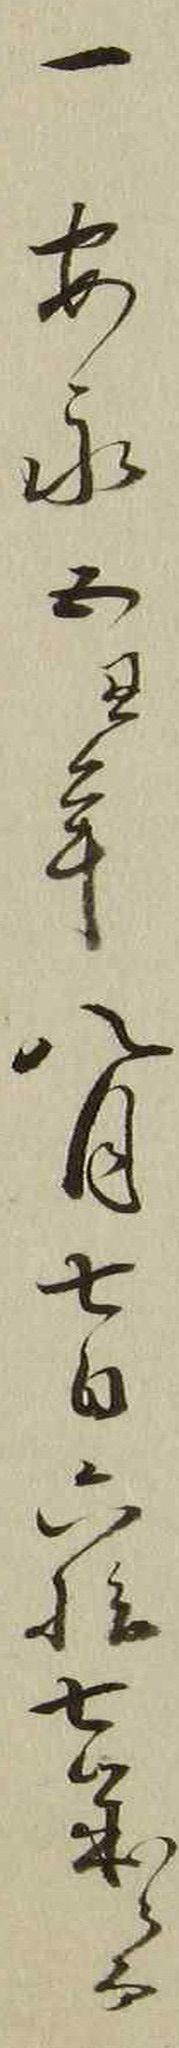一安永五丑年八月七日六拾七歳ニ而
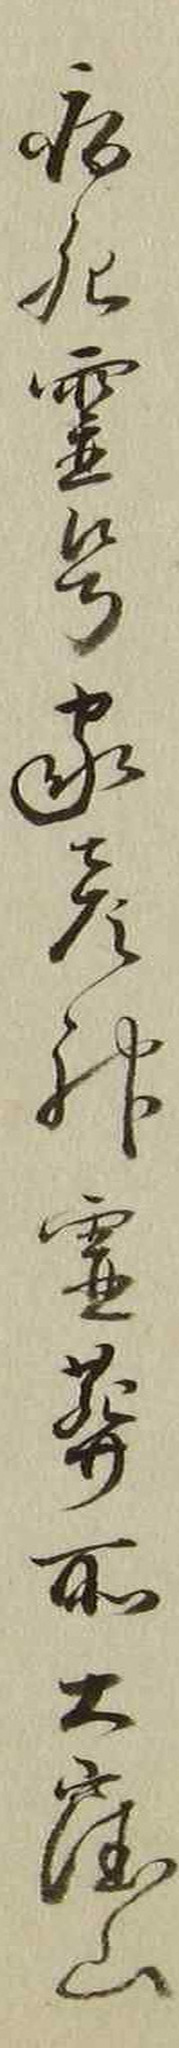病死霊号家彦神霊葬所大窪山
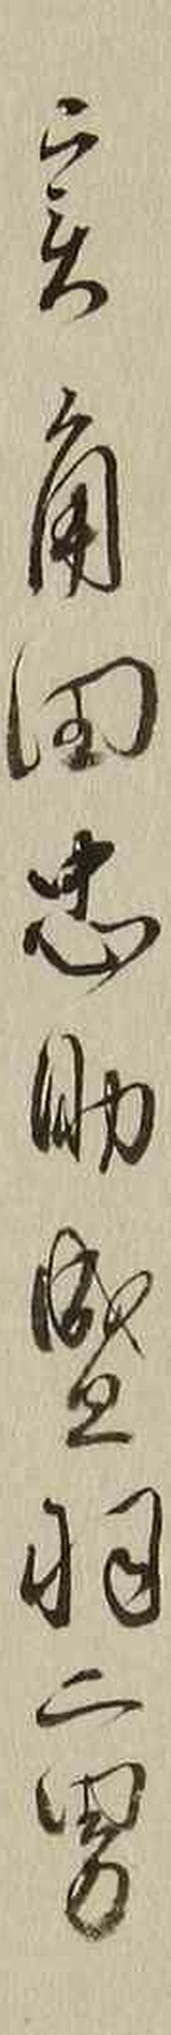実角田忠助盛羽二男
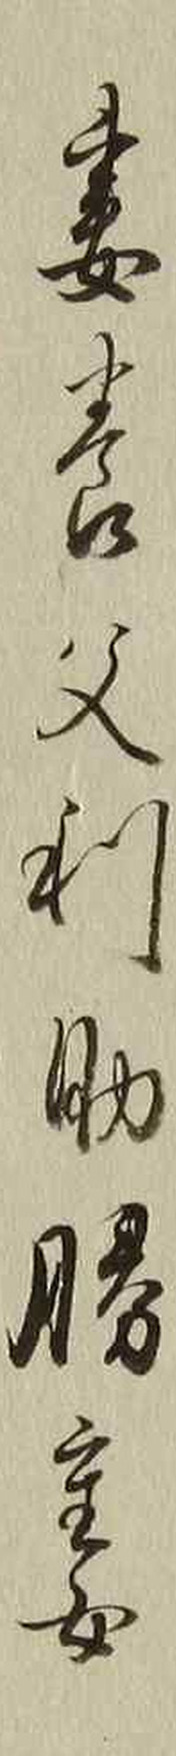妻養父利助勝重女
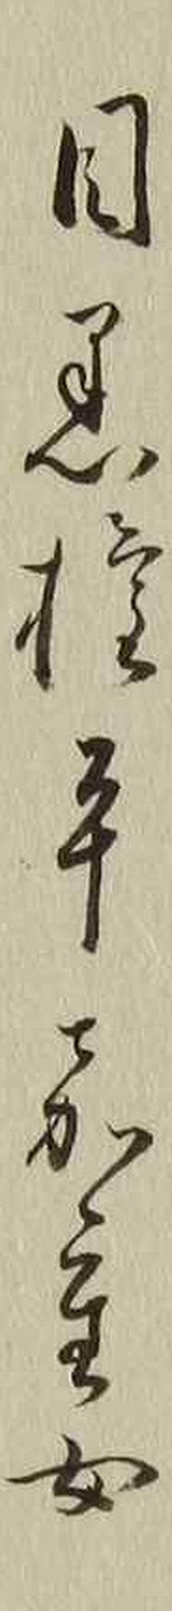目黒権平嘉重女
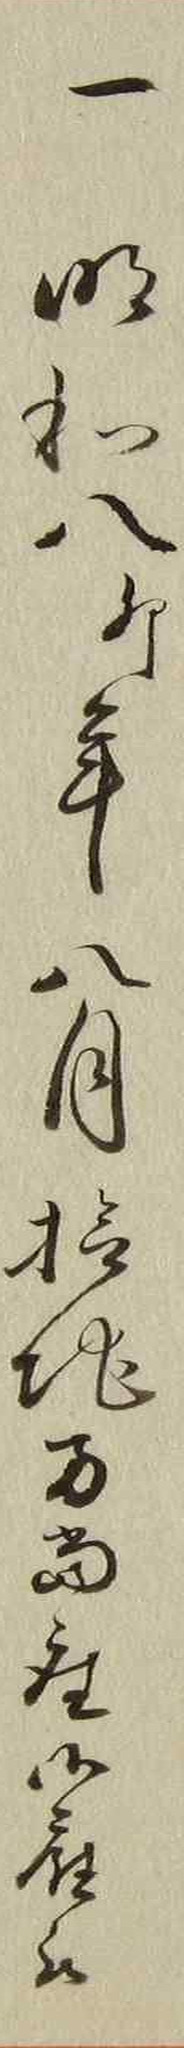一明和八卯年八月検地方当座御雇被
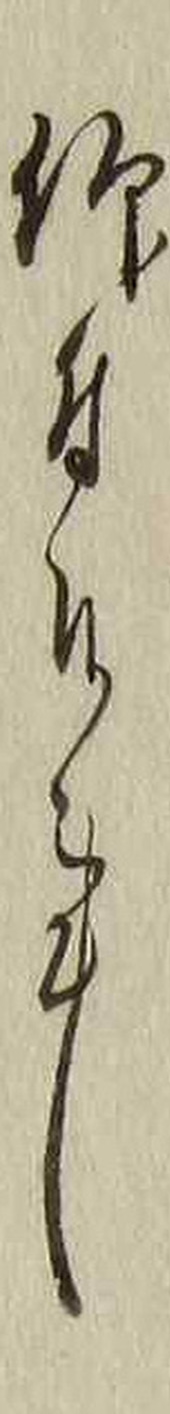仰付候事
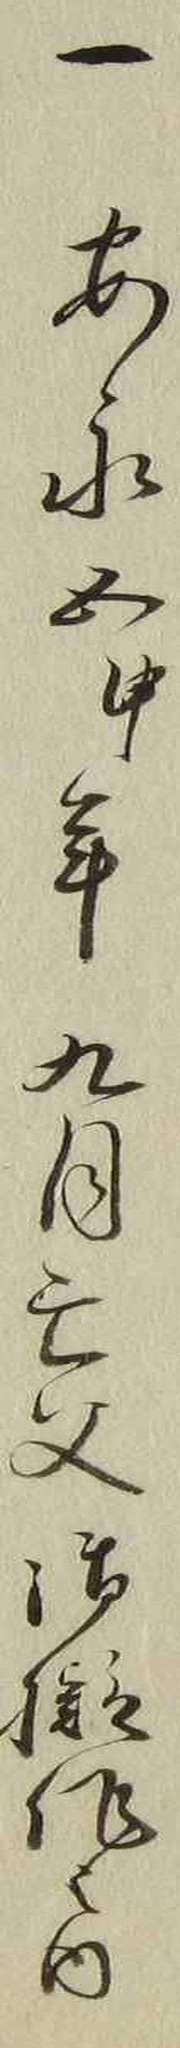一安永五申年九月亡父御擬作之内
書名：諸士系譜　巻之32　い之部32
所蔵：会津若松市立会津図書館
